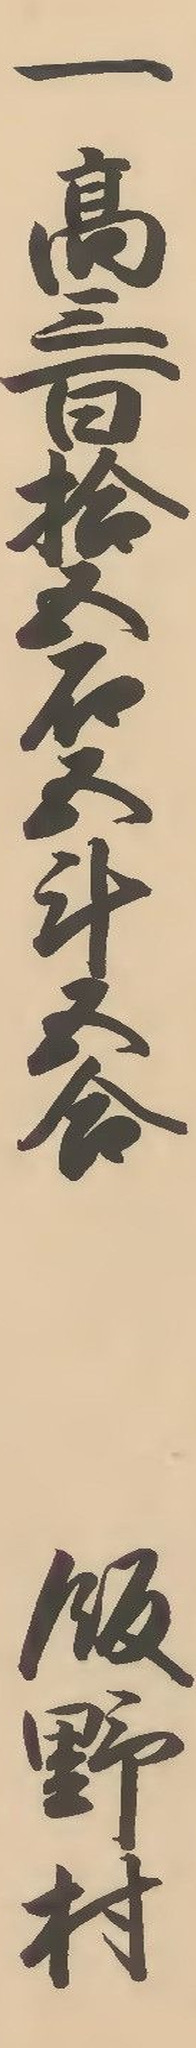一高三百拾五石五斗五合飯野村
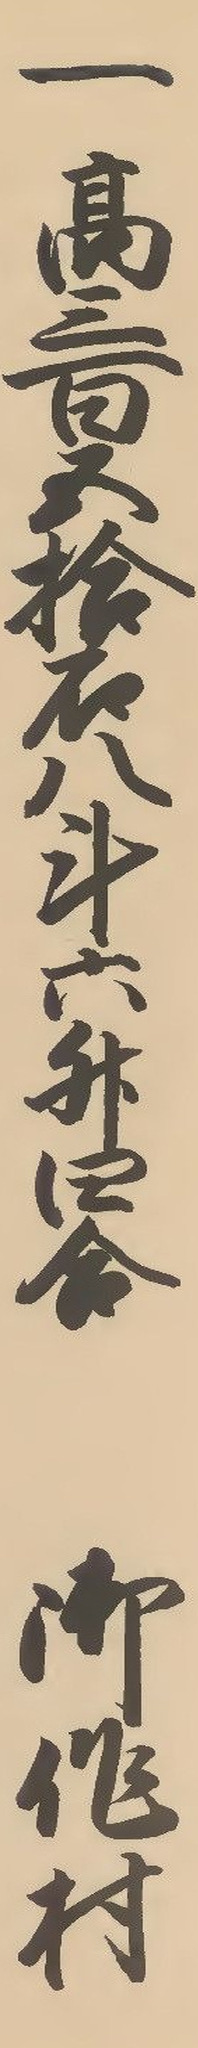一高三百五拾石八斗六升四合御作村
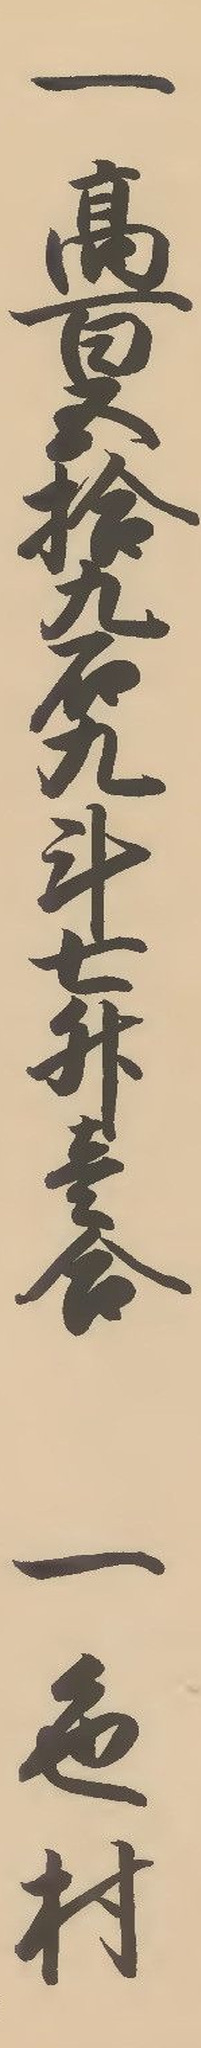一高百五拾九石九斗七升壱合一色村
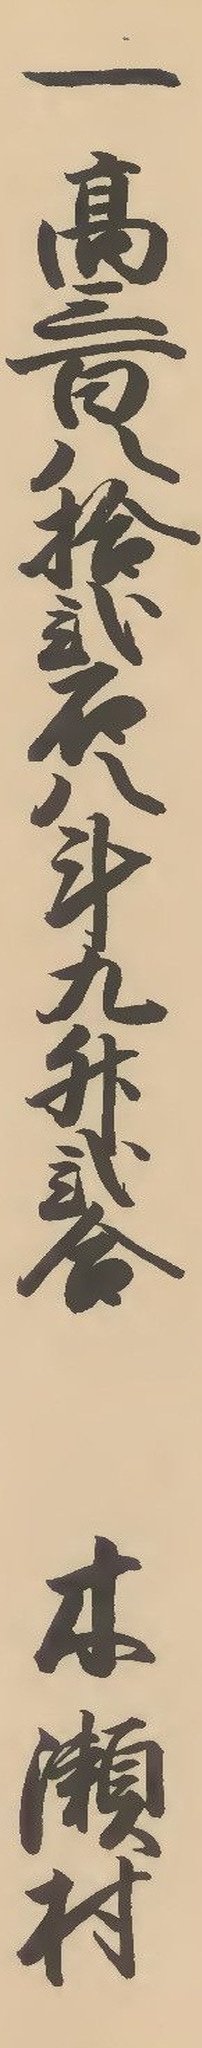一高三百八拾弐石八斗九升弐合木瀬村
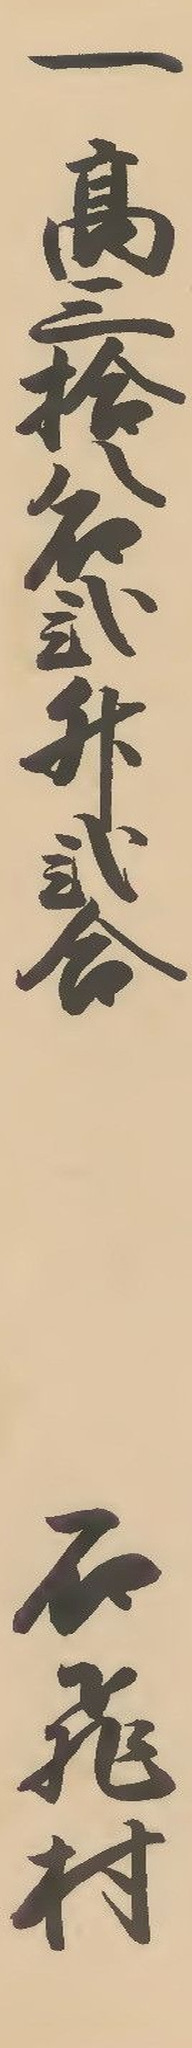一高三拾八石弐升弐合石飛村

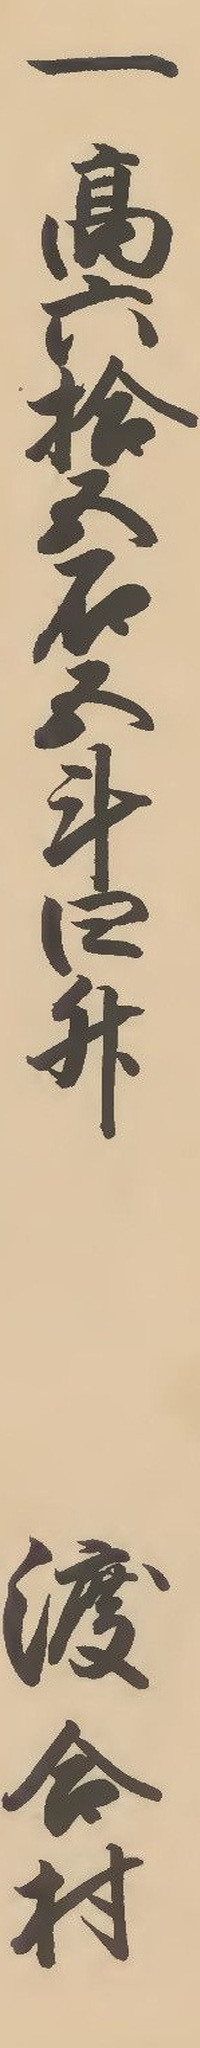一高六拾五石五斗四升渡合村
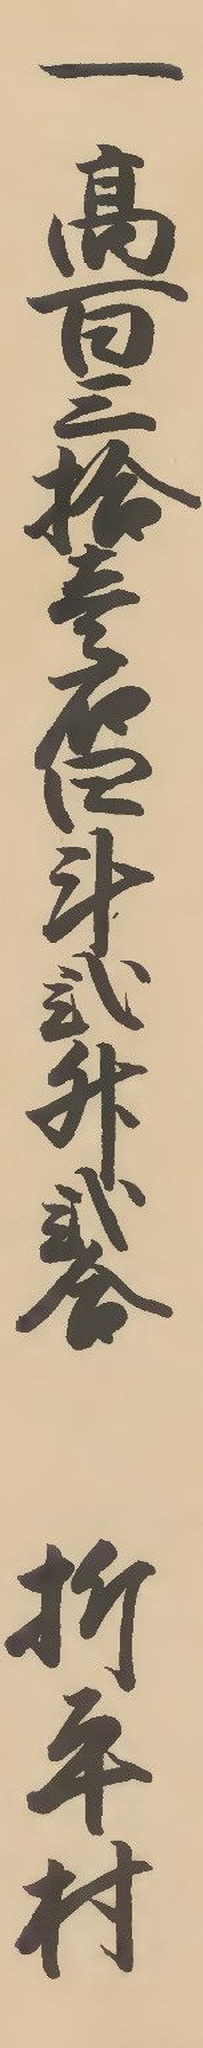一高百三拾壱石四斗弐升弐合折平村
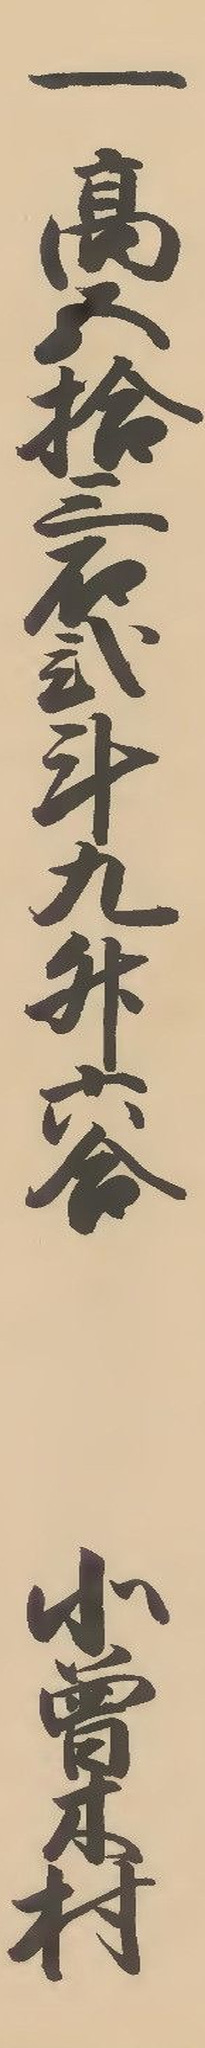一高五拾三石弐斗九升六合北曽木村
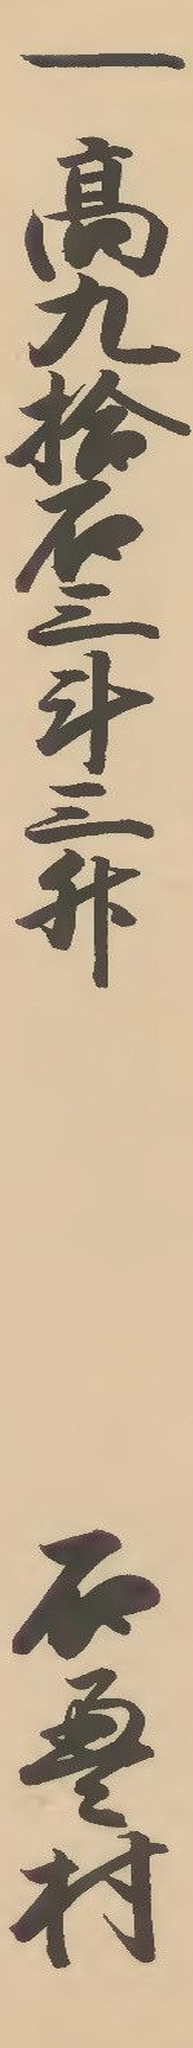一高九拾石三斗三升石畳村
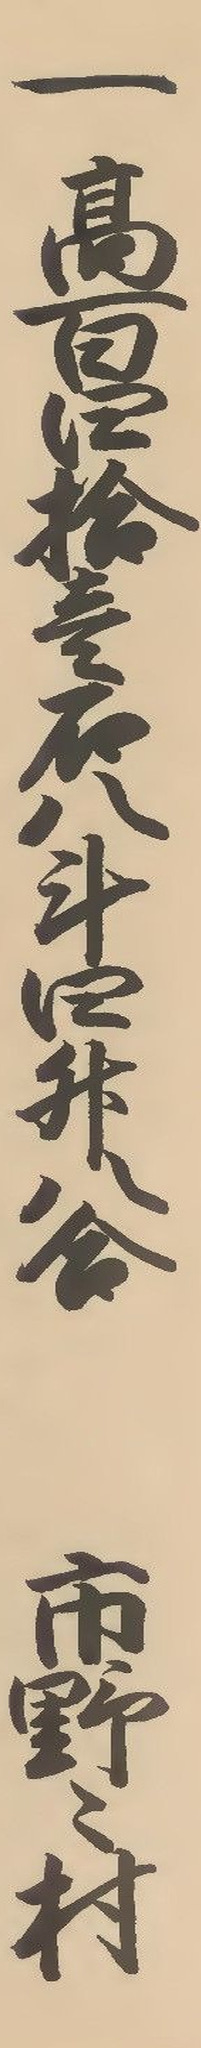一高百四拾壱石八斗四升八合市野々村
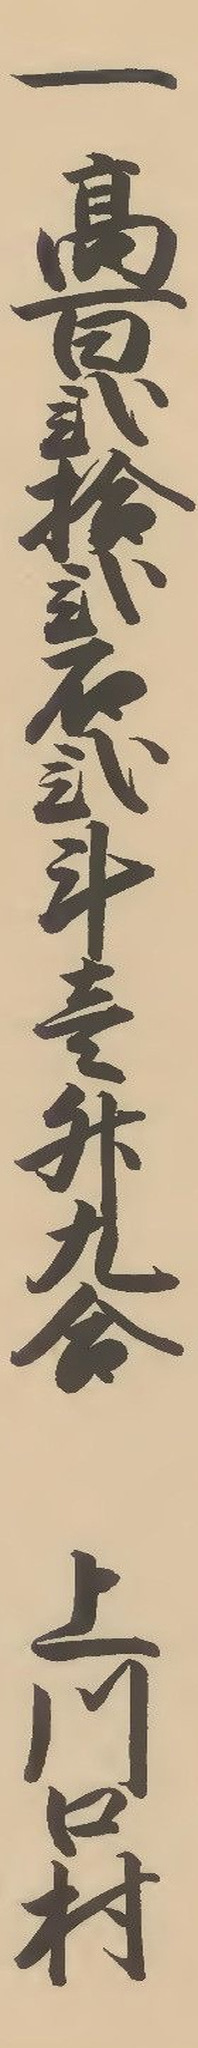一高百弐拾弐石弐斗壱升九合上川口村
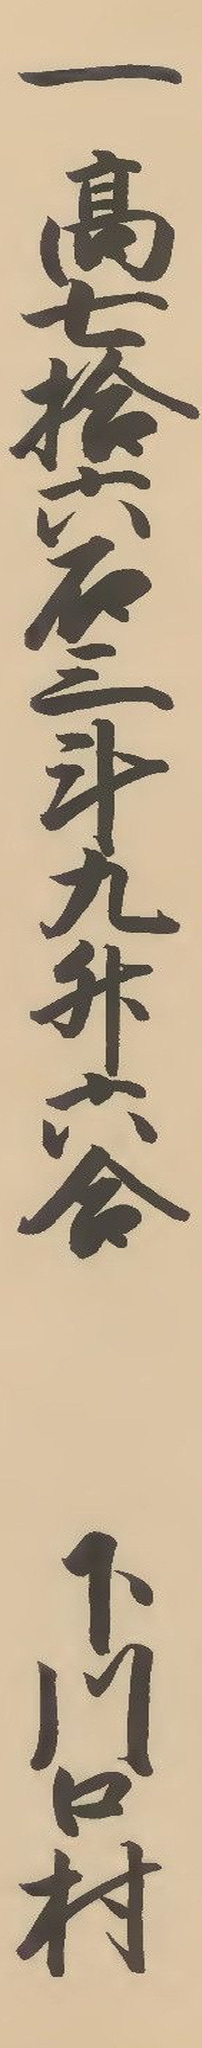一高七拾六石三斗九升六合下川口村
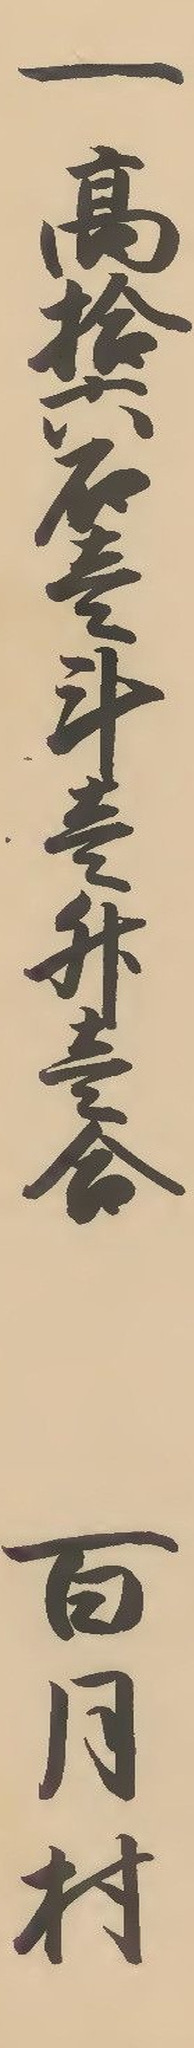一高拾六石壱斗壱升壱合百月村

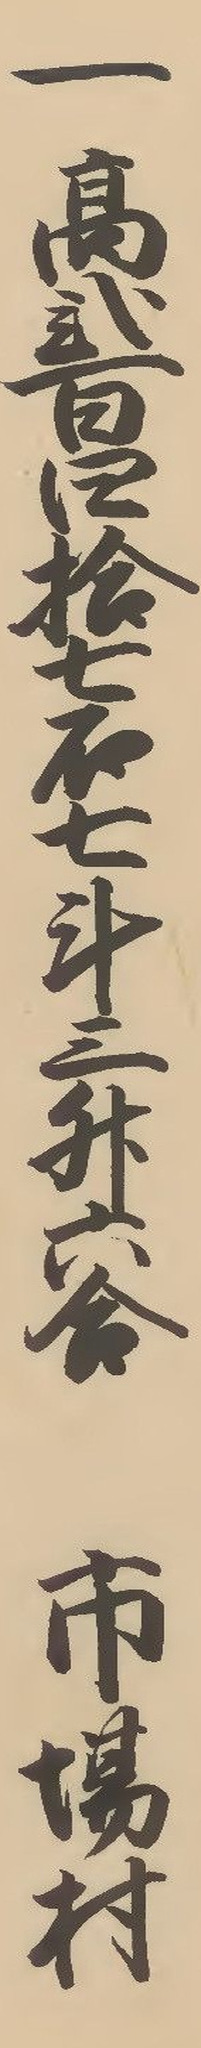一高弐百四拾七石七斗三升六合市場村
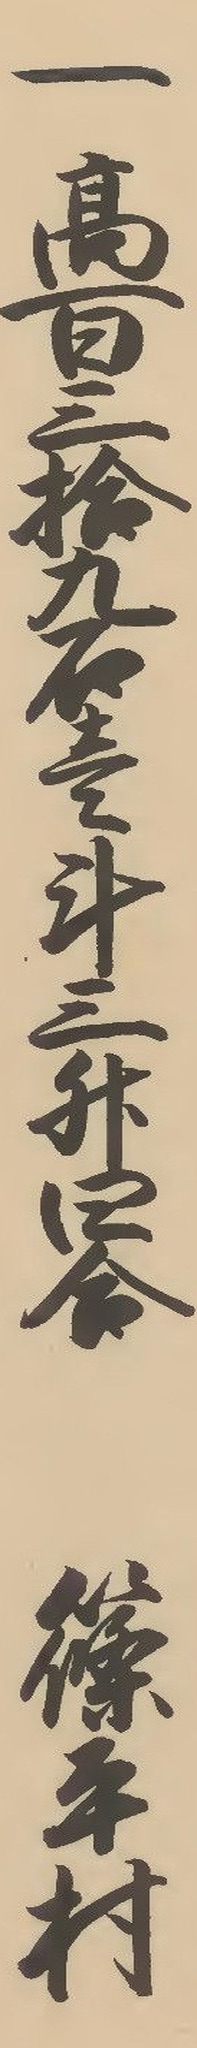一高百三拾九石壱斗三升四合篠平村
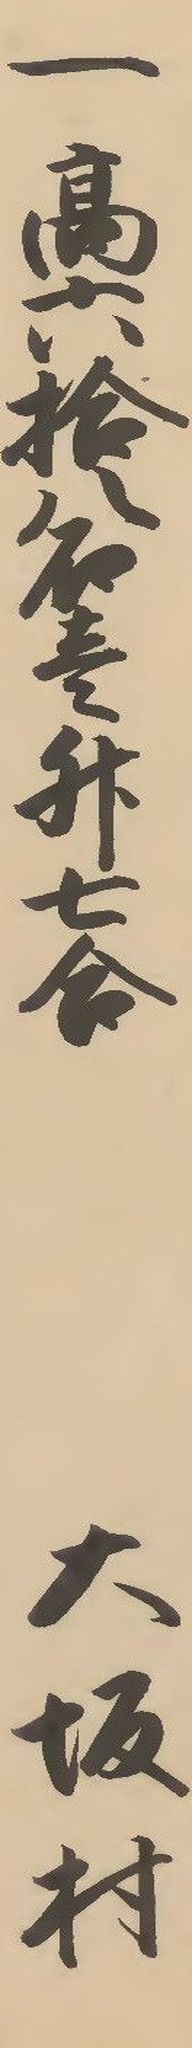一高六拾八石壱升七合大坂村
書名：三河国郷帳
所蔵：国立公文書館 National Archives of Japan
